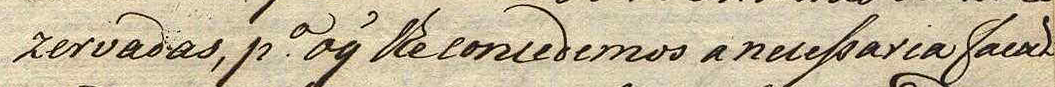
zervadas, p.a o q̄ lhe concedemos a necessaria facul
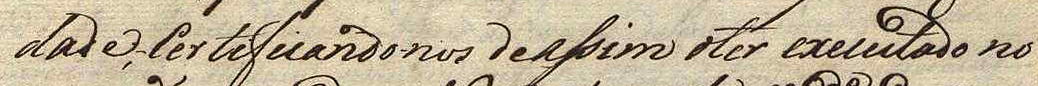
dade, Certeficando-nos de assim o ter executado no
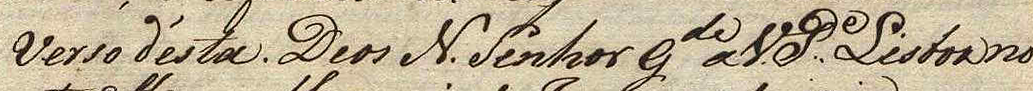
verso desta. Deos N. Senhor G.de a V. P.e Lisboa no
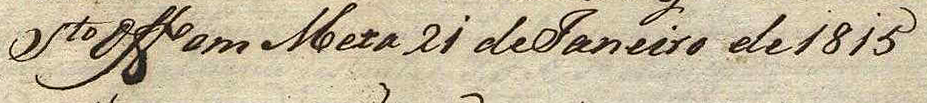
S.to Off.o em Meza 2i de Ianeiro de i8i5
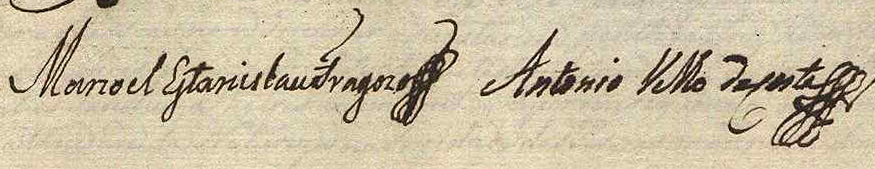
Manoel Estanislau Fragozo Antonio Velho da Costa
